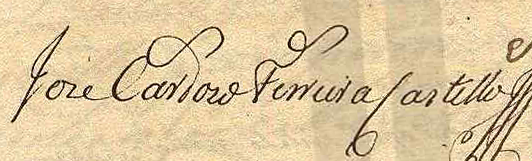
Joze Cardozo Ferreira Castello
